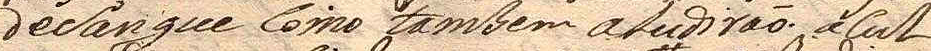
de Sangue como tambem aLudiraõ a Cul
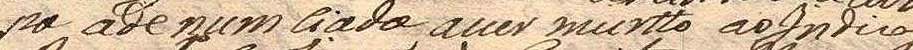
pa a denumciada auer murtto ao Jndio
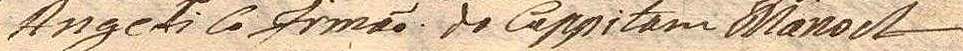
Angelico Jrmão do Cappitam ManoeL
